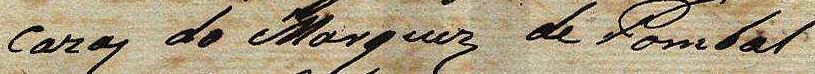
cazas do Marquez de Pombal
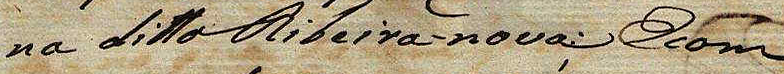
na ditta Ribeira-nova; E com
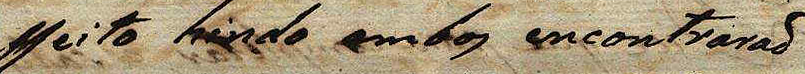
effeito hindo ambos encontraraõ
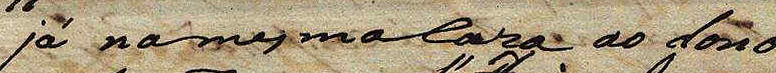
já na mesma caza ao dono
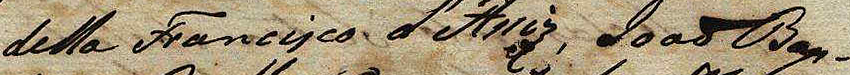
della Francisco d'Assiz, Joaõ Bap
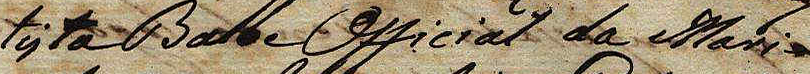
tista Balbe Official daMari
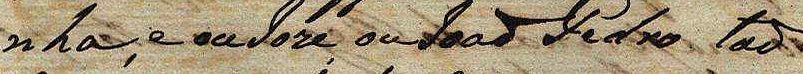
nha, e ou Joze, ou Joaõ Pedro taõ
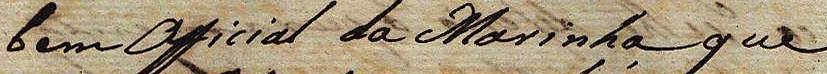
bem Official da Marinha que
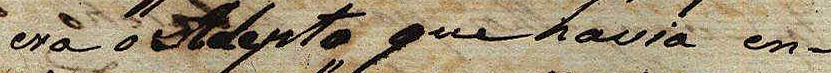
era o Adepto que havia en
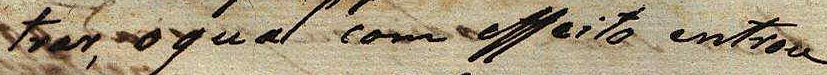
trar, o qual com effeito entrou
